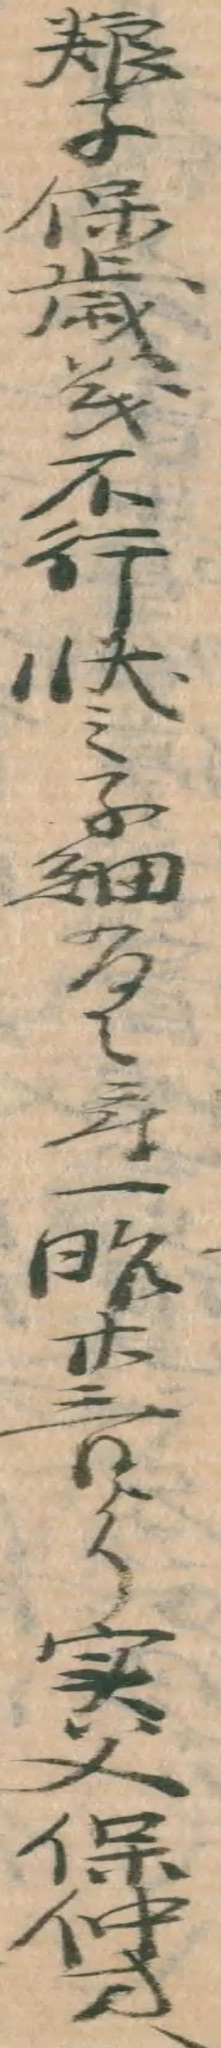養子保歳義不行状之子細有之ニ付一昨廿三日より実父保仲方へ
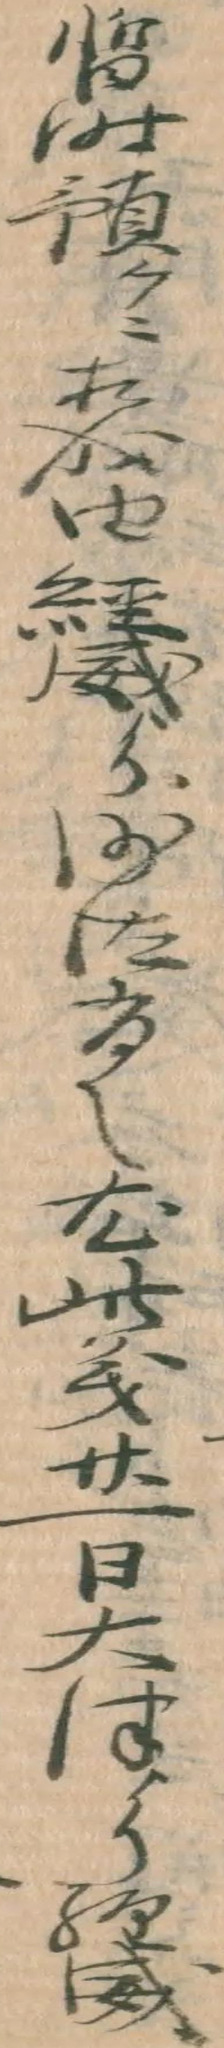暫時預ケニ相成由経威より沙汰有之尤此義廿一日大津より経威
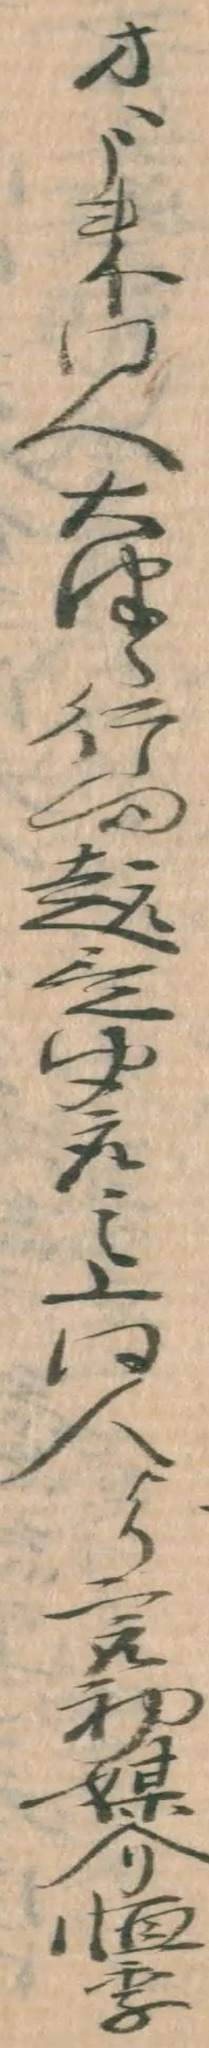方へ申来同人大津へ行向趣意聞取之上同人より最初媒介恒季
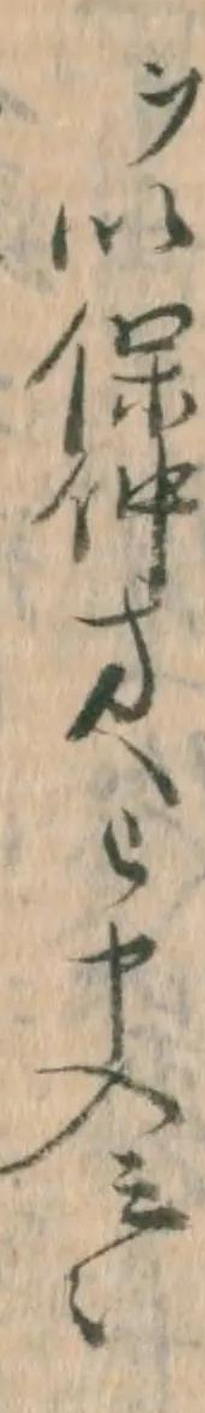ヲ以保仲方へ被申入云々
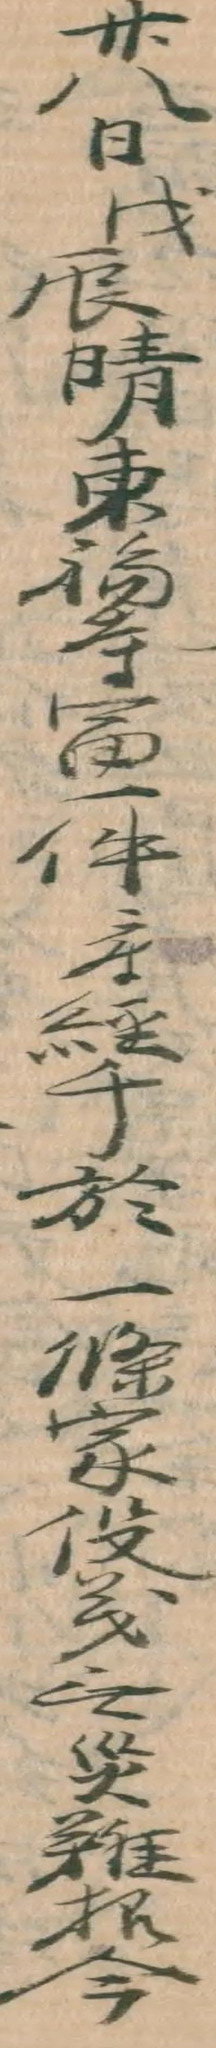廿八日戊辰晴東福寺富伴ニ付経千於一條家役義無災難招今
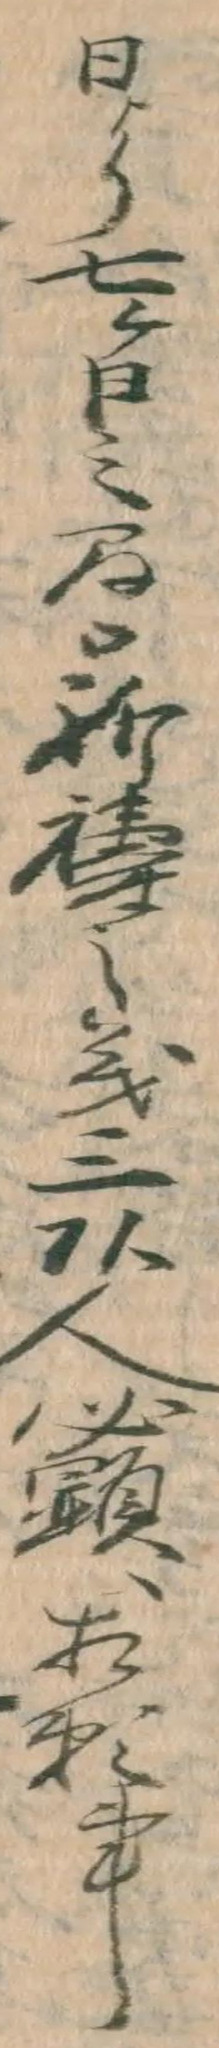日より七ヶ日之間御祈祷之義三頭人必顕へ相頼事
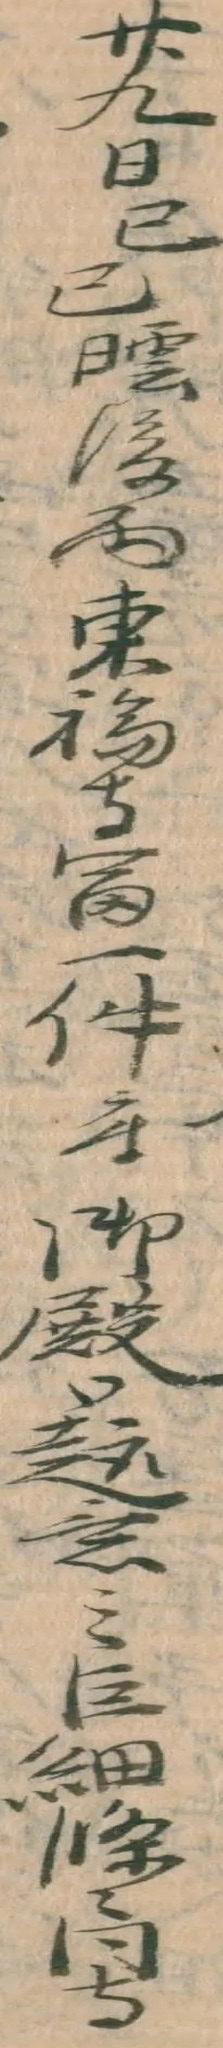廿九日己巳曇後雨東福寺冨一件ニ付御殿御趣意之巨細條々同寺
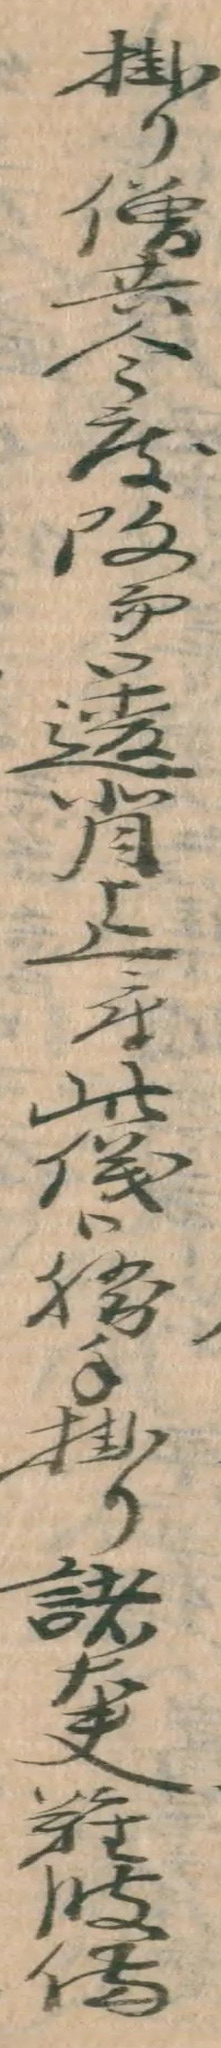掛り僧共今度改而御違背申上ニ付此儀御勝手掛り諸大夫難波備
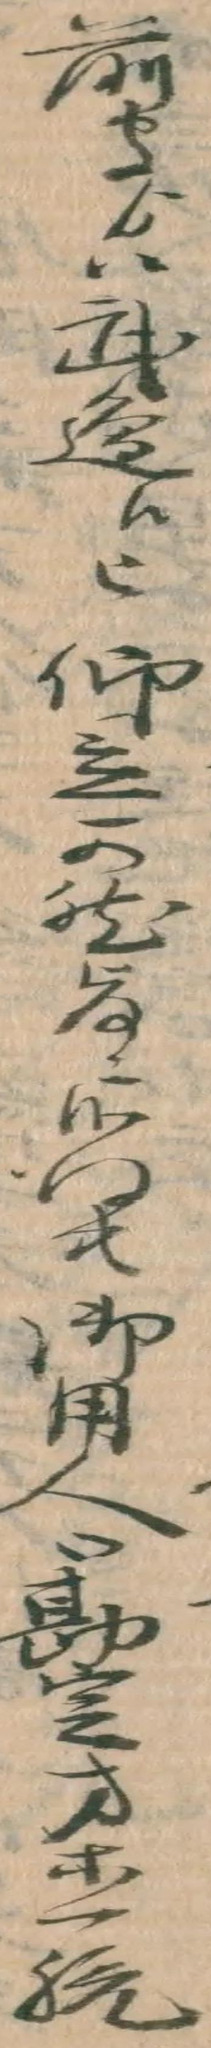前守ゟは武邊江被仰立可然旨ニ候得共御用人御勘定方等一統
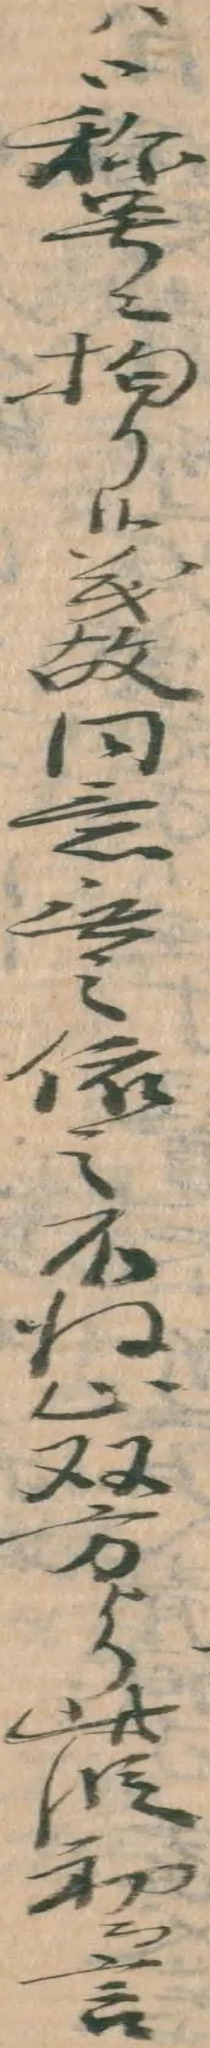ハ御称号ニ拘り候義故同意無之依之不得止双方より此段初而言
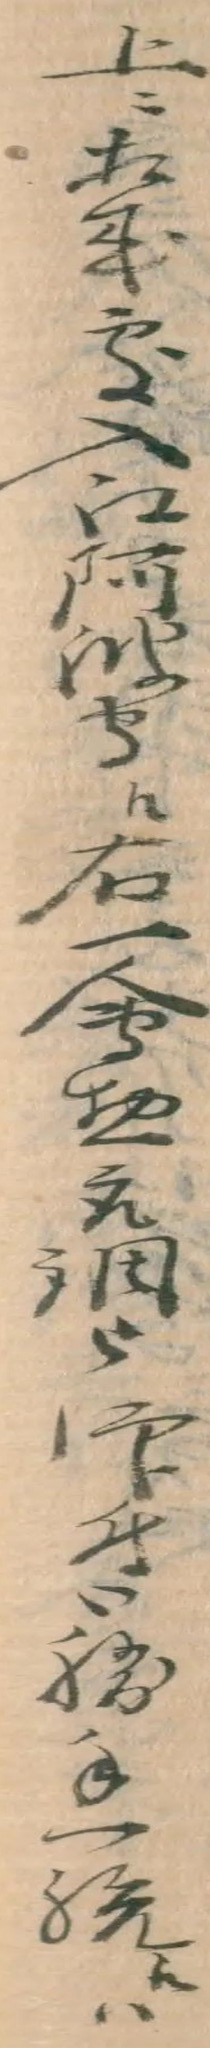上ニ相成處入江阿波守江右一會惣取調被仰付御勝手一統江ハ
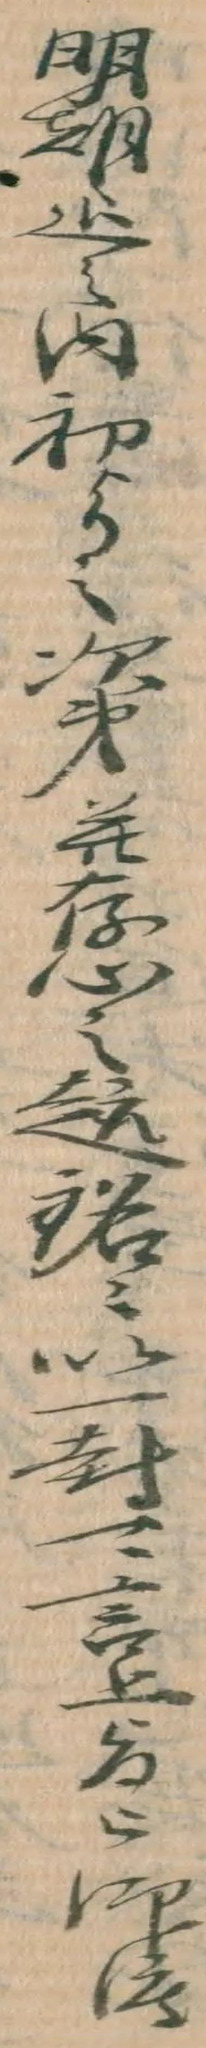明朝迄之内初より之次第并存心之趣諾々以一對可言上旨被仰渡
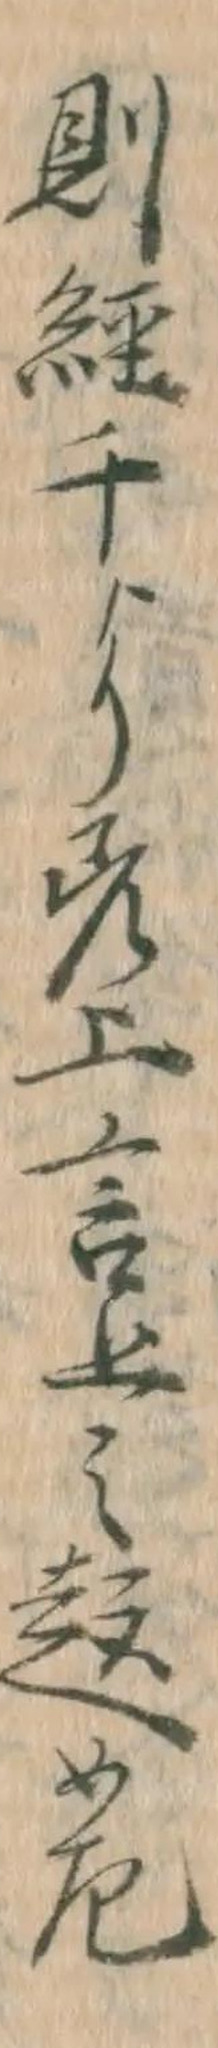則経千より差上言上之趣如左
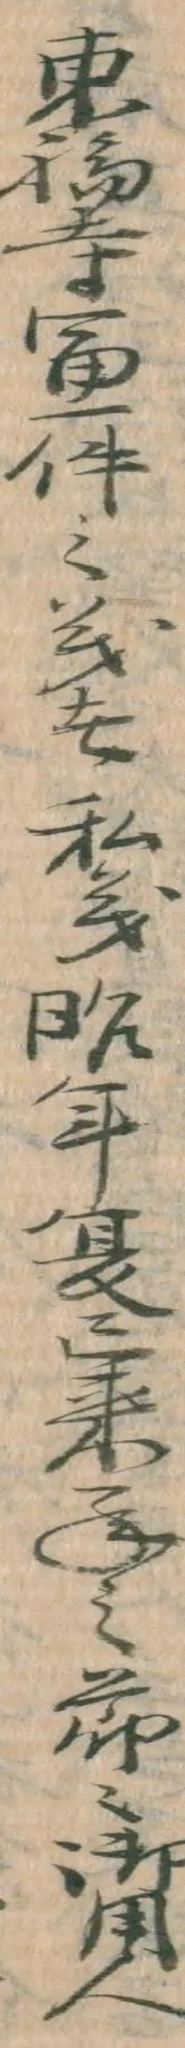東福寺冨一件之義者私義昨年夏已来年之節々御用人
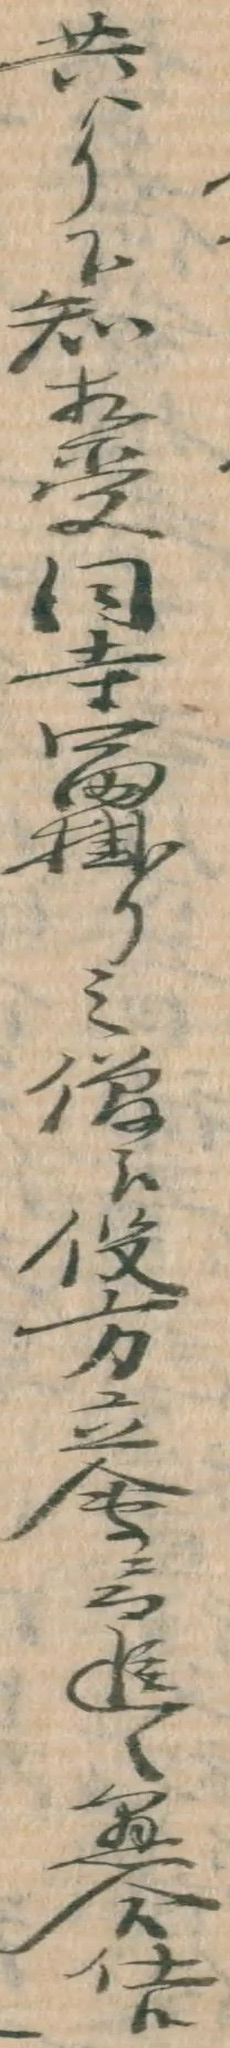共より下知相受同寺富掛り之僧江役方立會ニ而追々懸合仕候
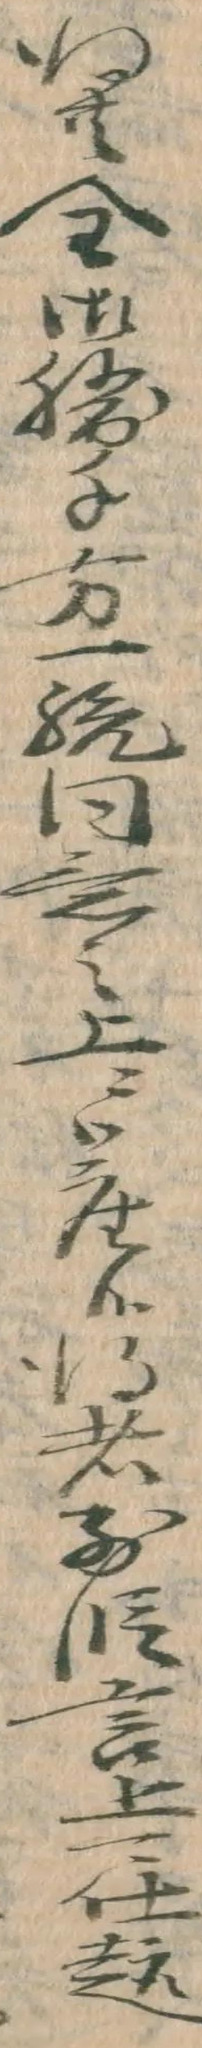得共全御勝手分一統同意之上ニ御座候得者別段言上可仕趣
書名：賀茂社記録. 第65冊
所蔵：国立国会図書館 National Diet Library, JAPAN
